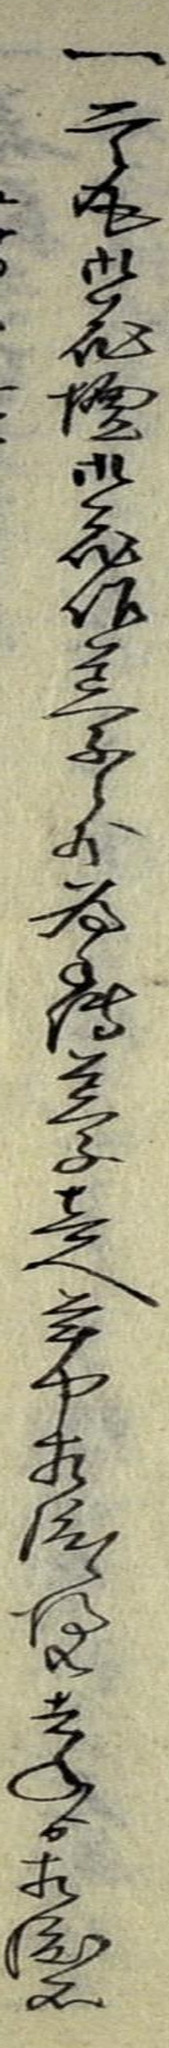一二之丸御花壇御花作荒子之外為手伝荒子壱人年中相渡候得共去年ゟ相渡不
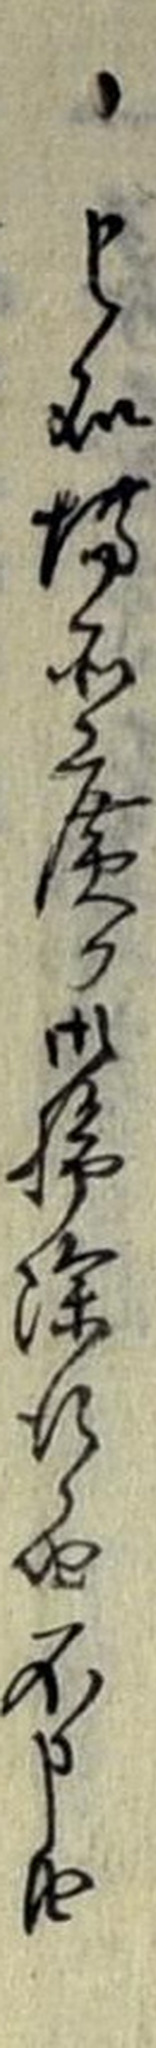申候処場所広ク御掃除行届不申由
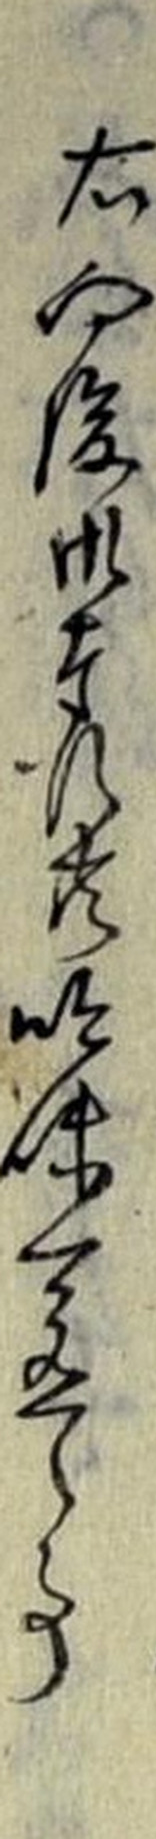右向後御奉行共吟味可有之事
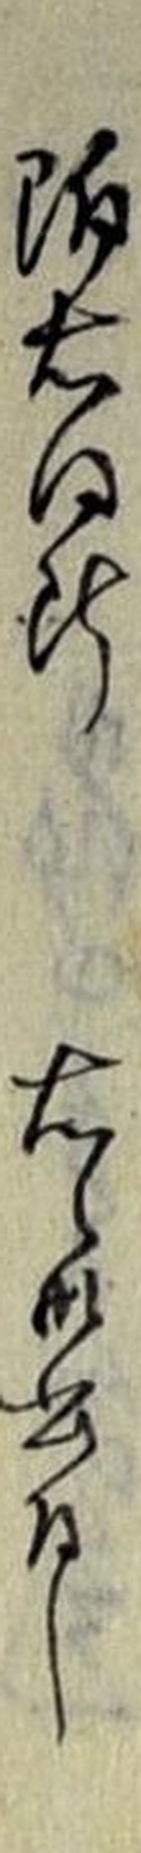附右同断右之御書付之
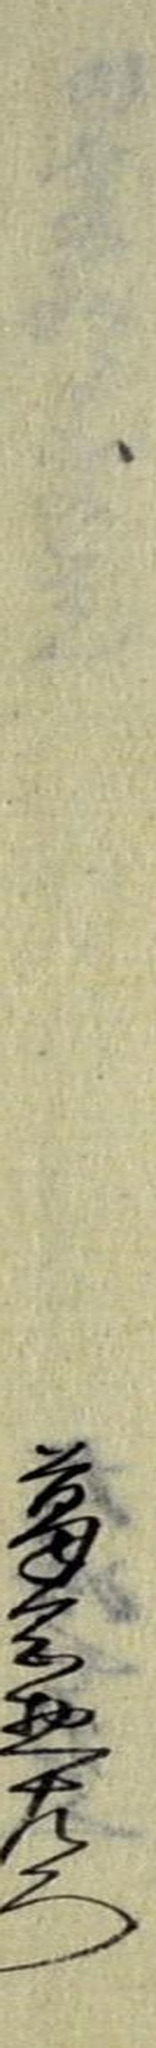葛岡惣左衛門
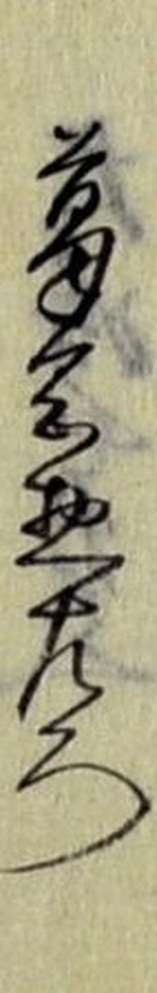葛岡惣左衛門
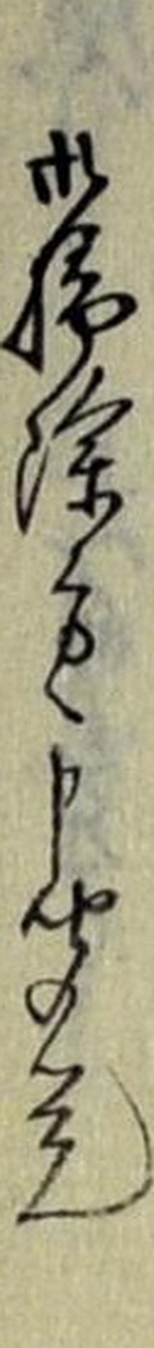御掃除方へ申聞覚
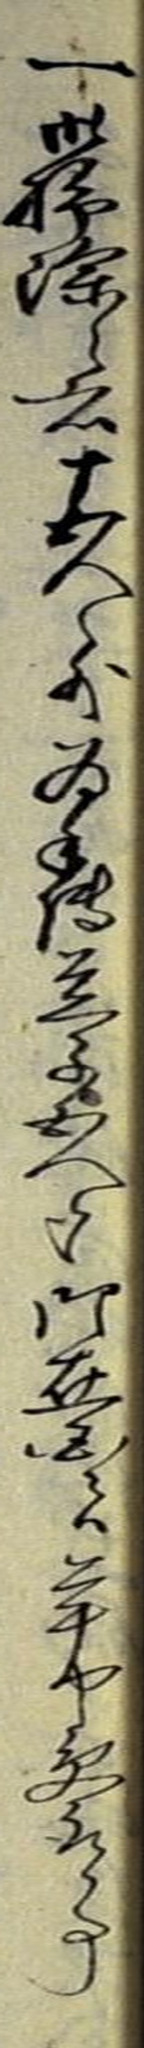一御掃除之者十五人之外為手伝荒子五人ツヽ御在国ニハ年中受取候事
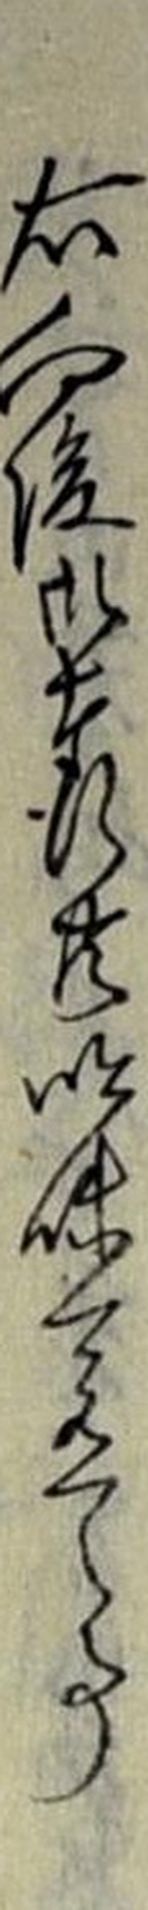右向後御奉行共吟味可有之事
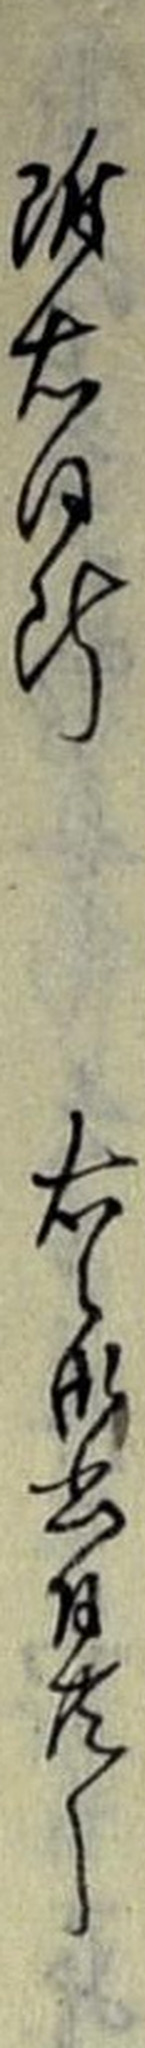附右同断右之御書付共之
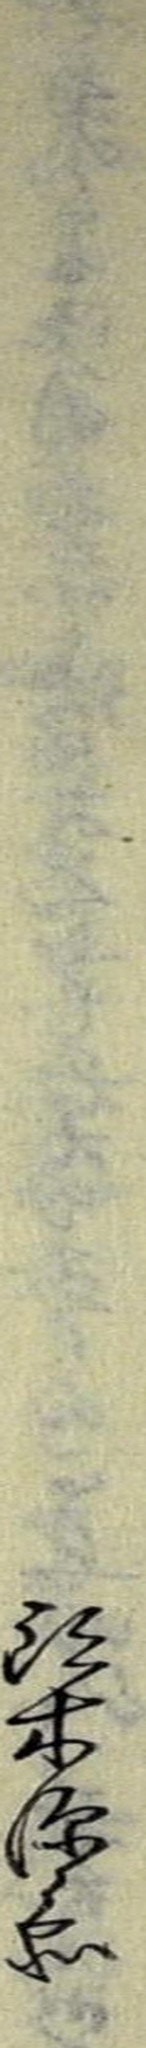鈴木源兵衛
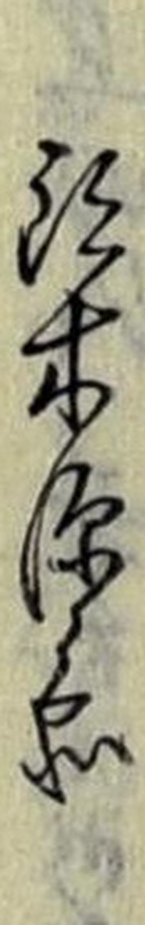鈴木源兵衛
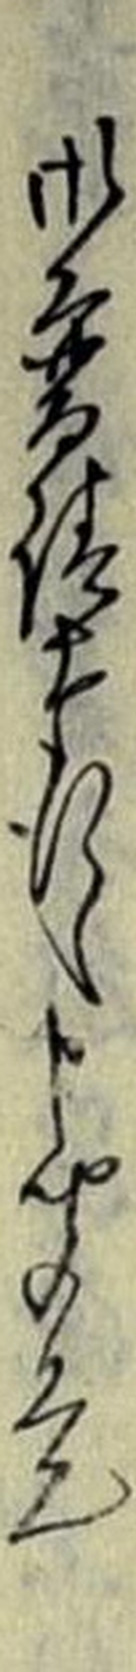御普請奉行へ申聞覚
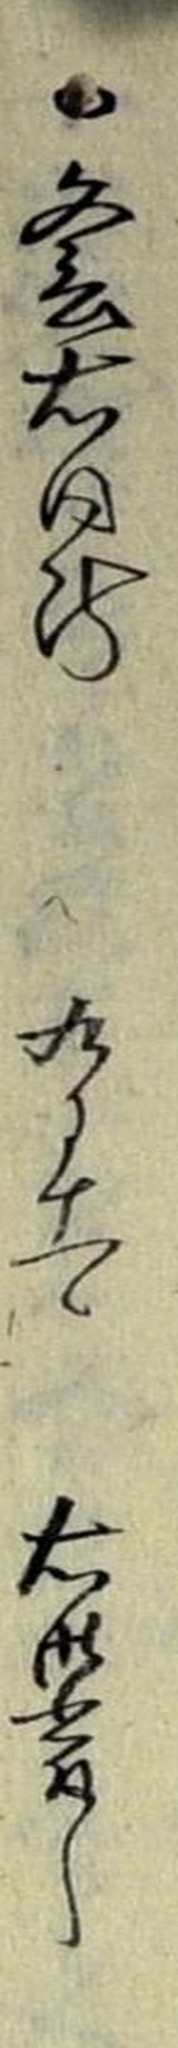〇文言右同断九月十一日右御書付之
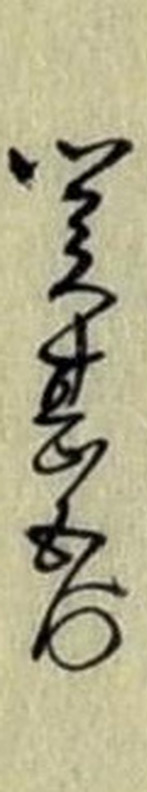関甚五右衛門
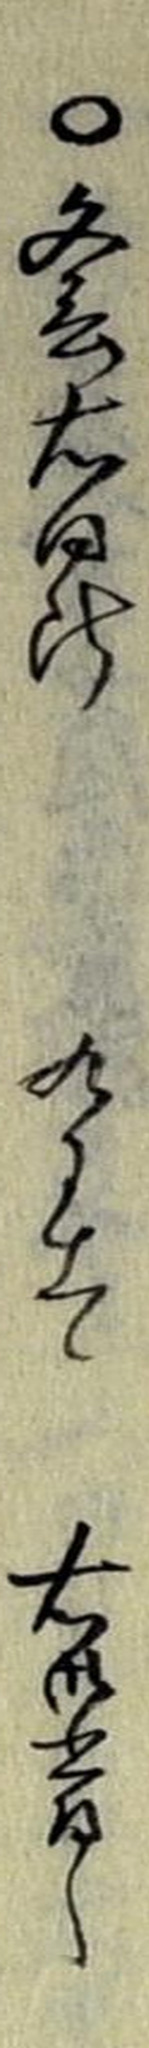〇文言右同断九月十一日右御書付之
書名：命令之部 一
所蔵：福井県文書館 Fukui Prefectural Archives
